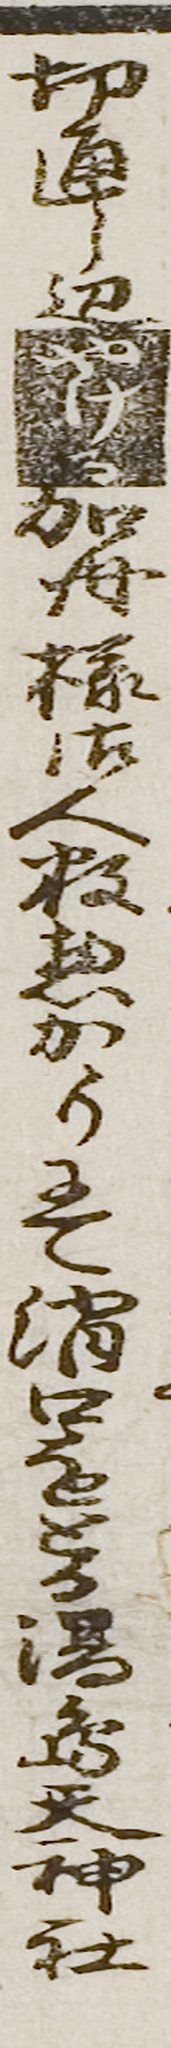切通し辺やける加州様御人数惣かゝりにて消口をとる湯嶋天神社
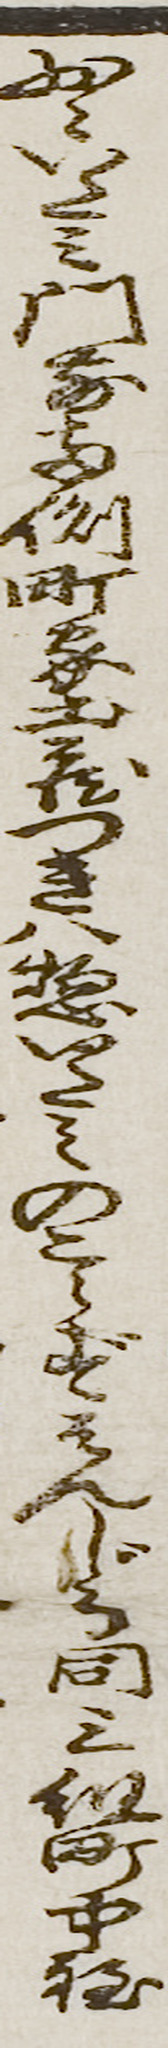少々いたミ門家両側町家土蔵つきハ惣いたミのこらずそんじる同ミ組町中程
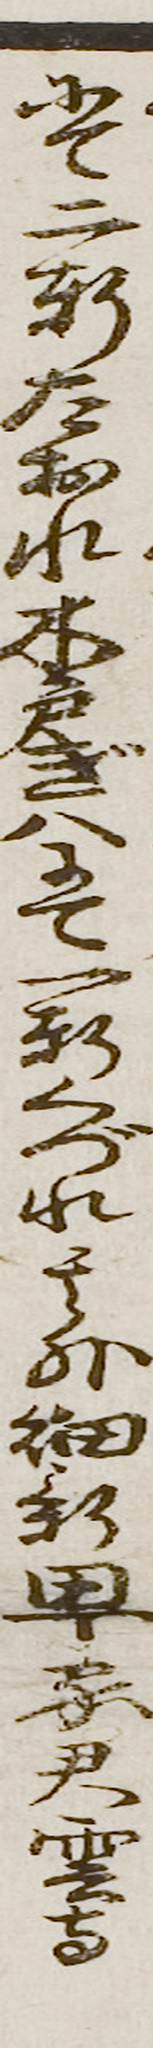にて二軒たおれ木戸ぎハにて一軒くづれその外畑新田丁家灵雲寺
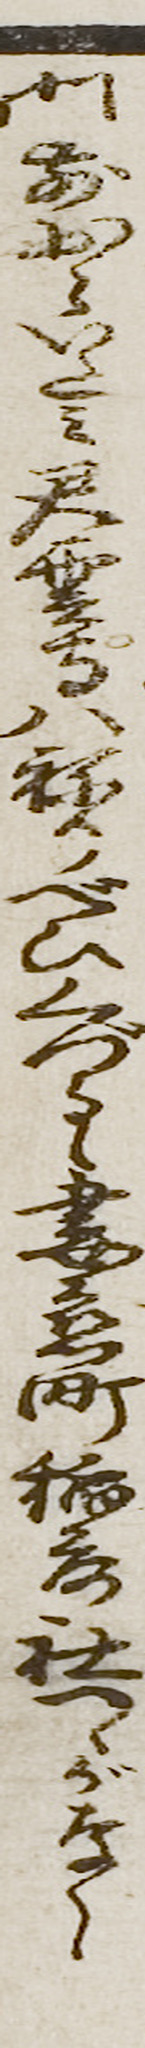門前少々いたミ灵雲寺ハねりべひくずるゝ妻恋町稲荷社つゝがなし
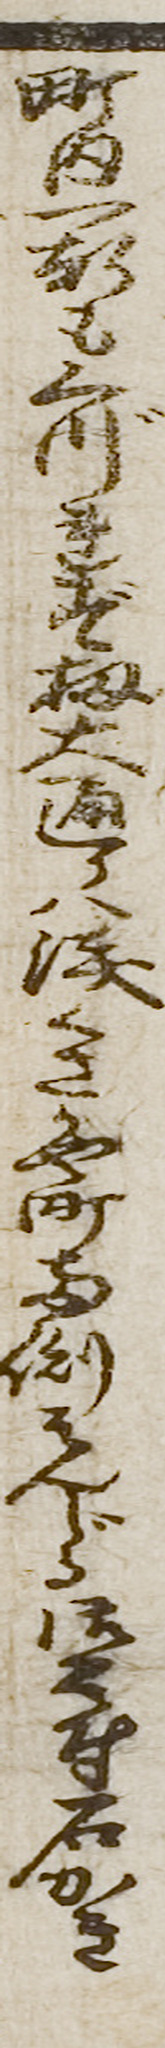町内一軒もくづれず扨大通リハ浅くさかや町両側そんじる御目付石かき
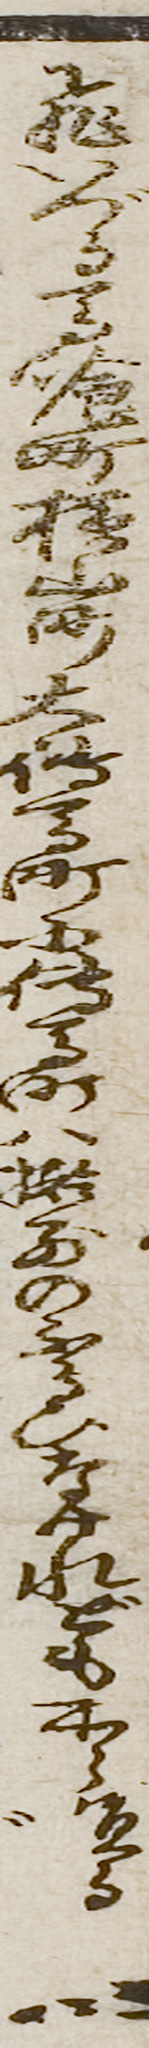飛いづる馬喰町横山町大傳馬町小傳馬町ハ格別のふるひなけれども少々やける
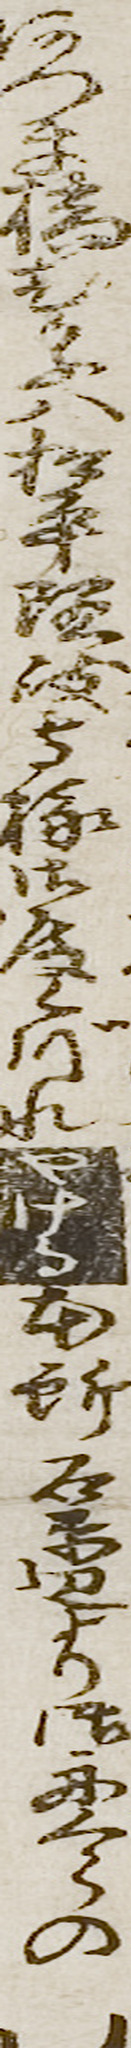あつま橋むかうハ松平隠岐守様御屋くずれやける本所石原辺より御舟ぐらの
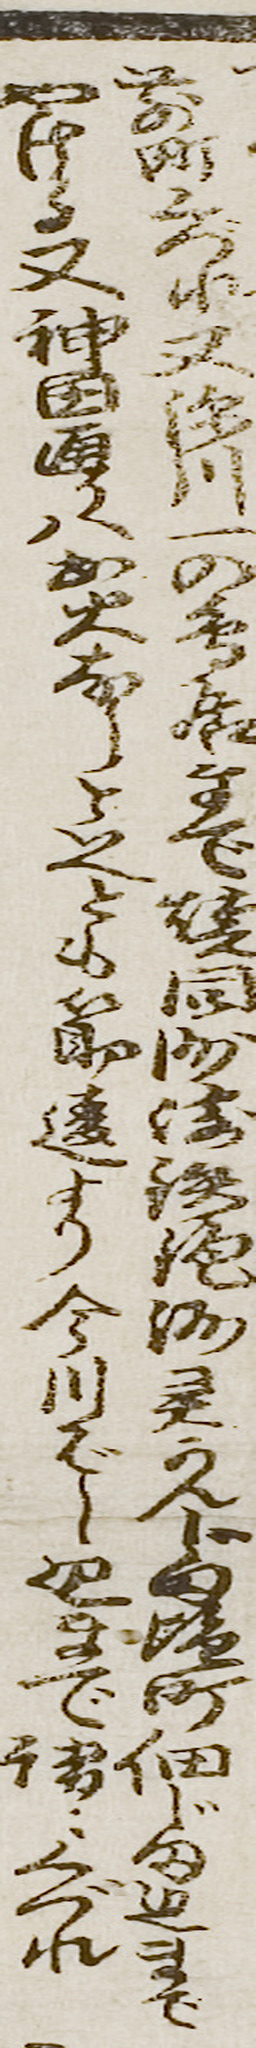やける又神田通りハ出火なしといへとも筋違より今川ばしまで諸々くづれ
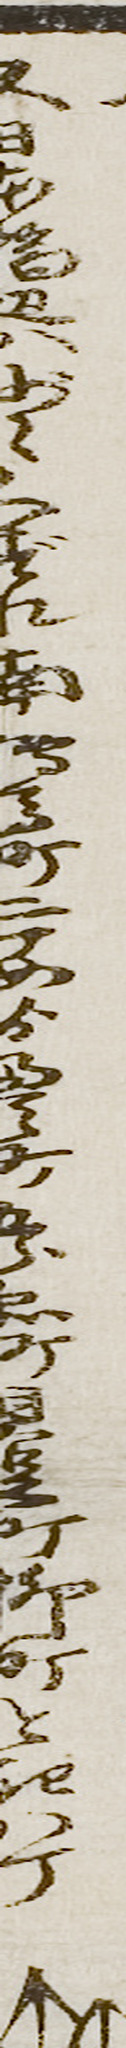又日本橋辺ハ少々くづれ南伝馬町二丁めゟ畳町五郎兵衛町具足町柳町ときハ丁
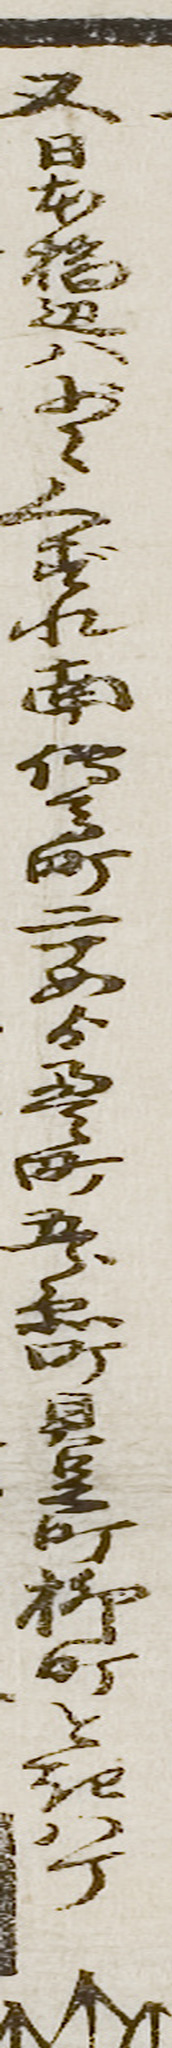又日本橋辺ハ少々くづれ南伝馬町二丁めゟ畳町五郎兵衛町具足町柳町ときハ丁
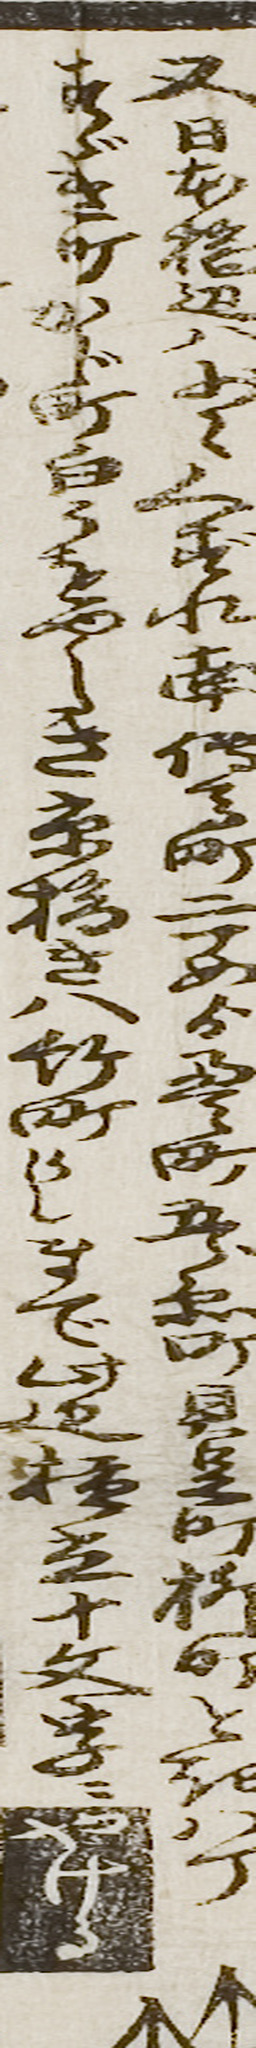すゞき町かじ町白うをやしき京橋きハ竹町かしまで此辺煙立十文字二やける
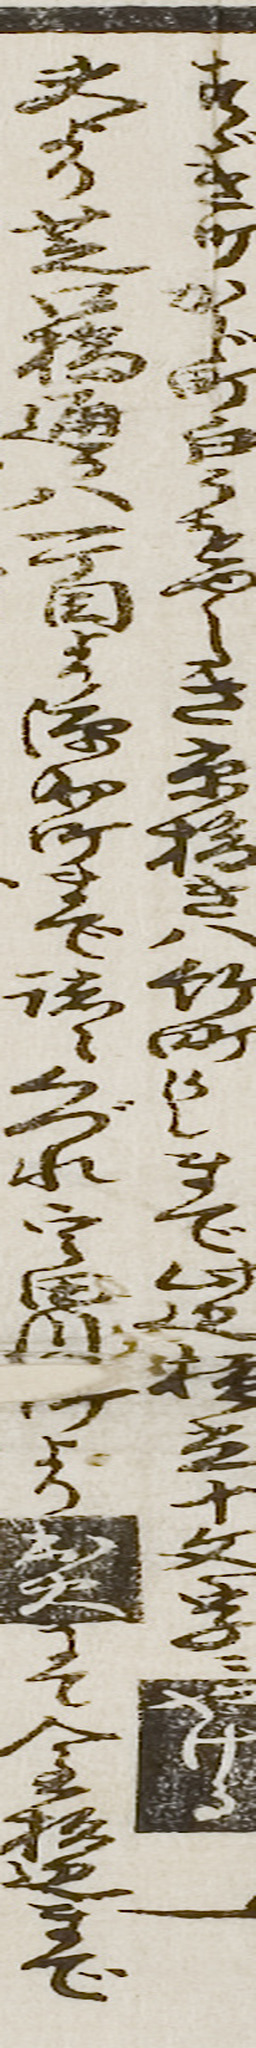夫より柴口橋通りハ一丁目より源助町まで諸々くづれ宇田川町より出火にて金杉辺まで
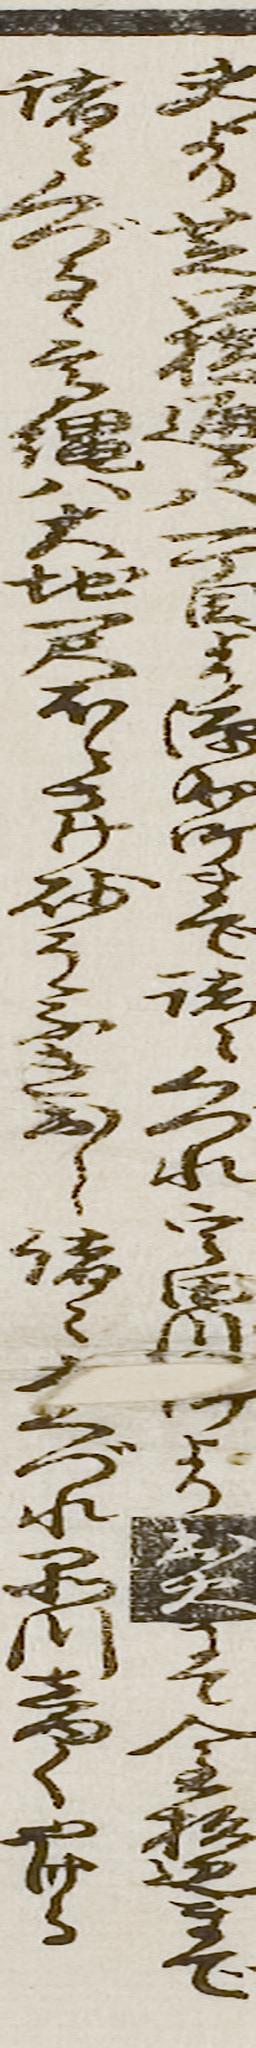諸々くづるゝ高縄ハ大地一尺ほとさけ砂りふき出し諸々大くづれ品川しゆくやける
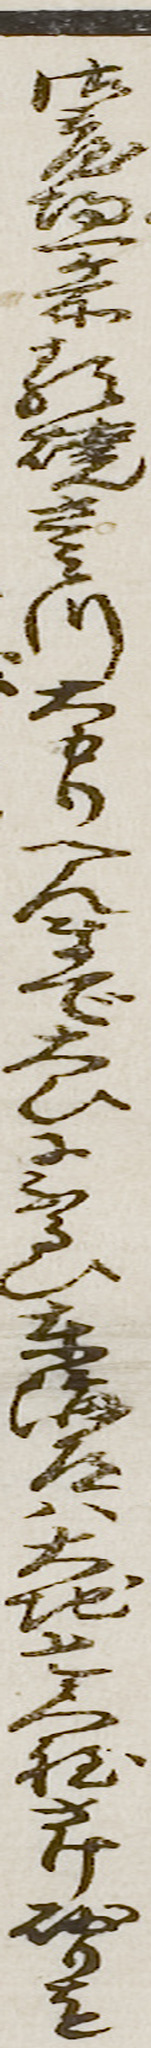御台場一ヶ所類焼さ之川大もりへんまで大ひにふるひ東海道ハ大地六尺程さけ砂りを
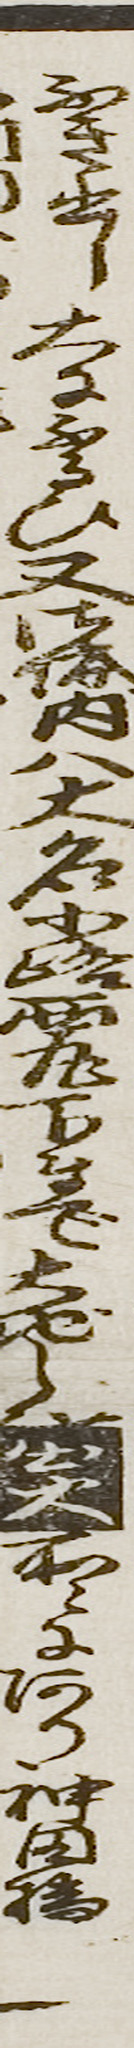ふき出し大にふるひ又御城内ハ大名小路西丸下まで大地しん出火所々あり神田橋
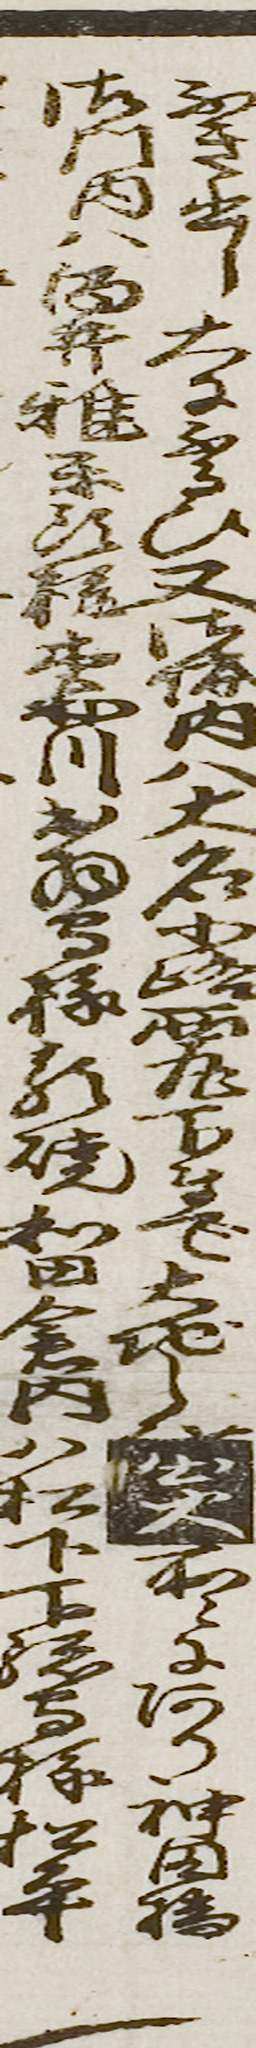御門内ハ酒井雅楽頭様森川出羽守様類焼和田倉内ハ松下下総守様松平
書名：関東江戸大地震并大火方角場所附
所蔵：東京大学総合図書館 General Library in the University of Tokyo, JAPAN
